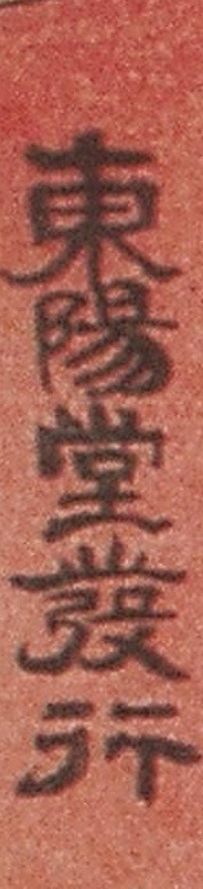東陽堂發行

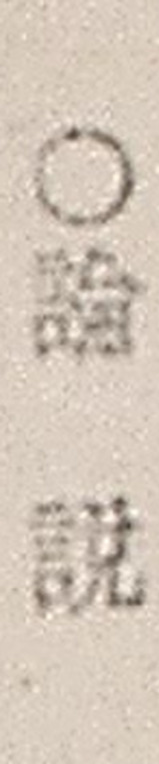○論説
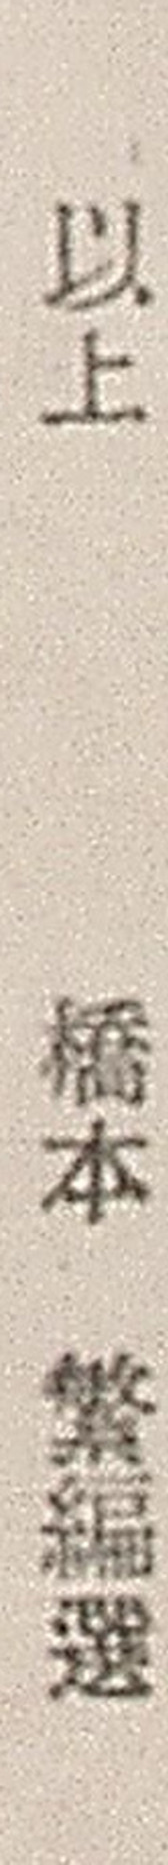以上橋本繁編選
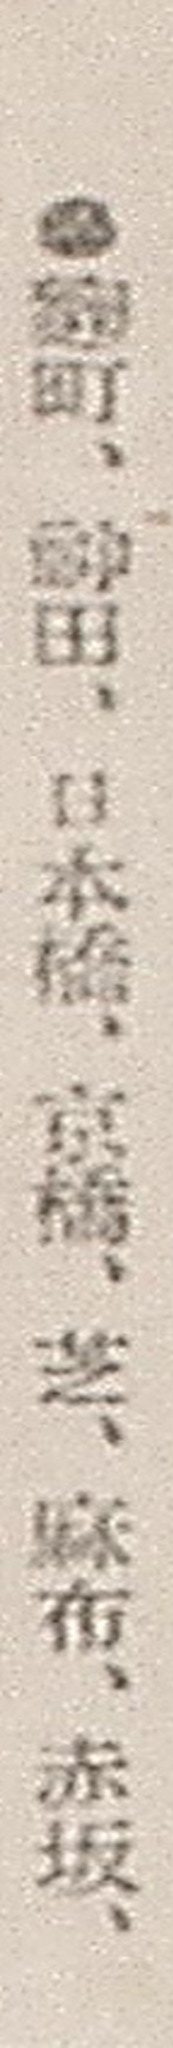●麹町、神田、日本橋、京橋、芝、麻布、赤坂、
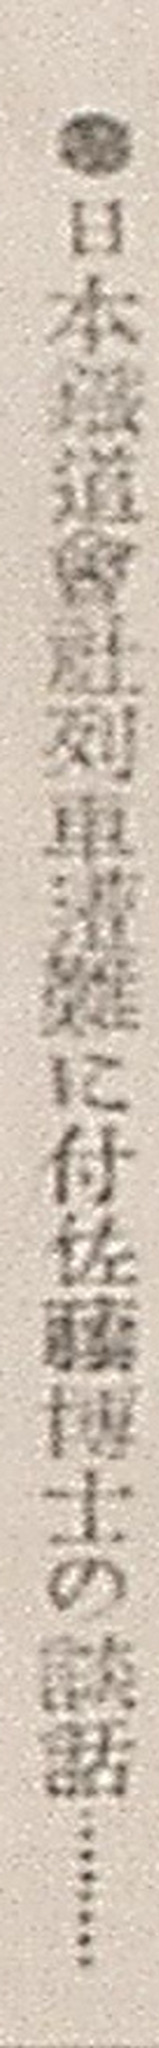●日本鉄道会社列車遭難に付佐藤博士の談話・・
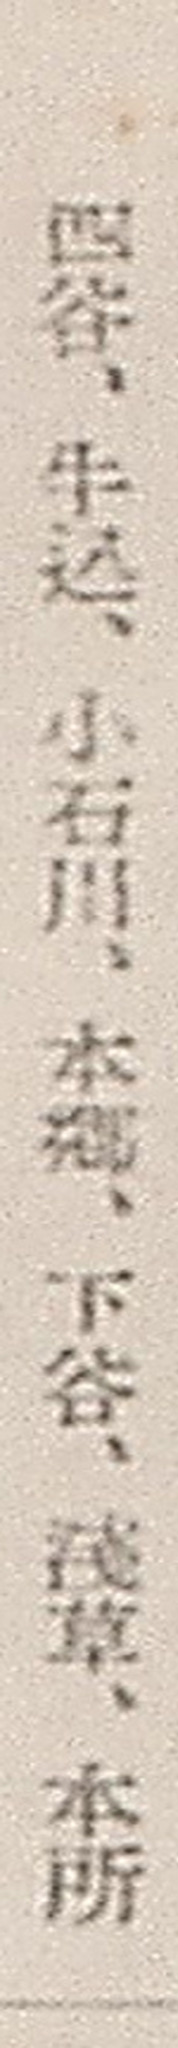四谷、牛込、小石川、本郷、下谷、浅草、本所
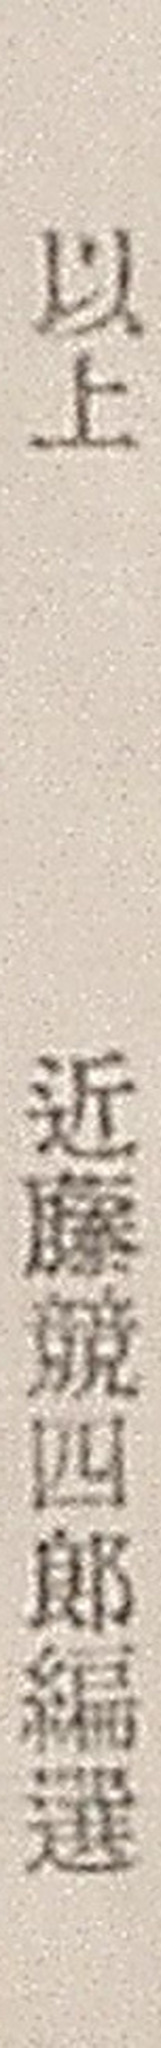以上近藤競四郎編選
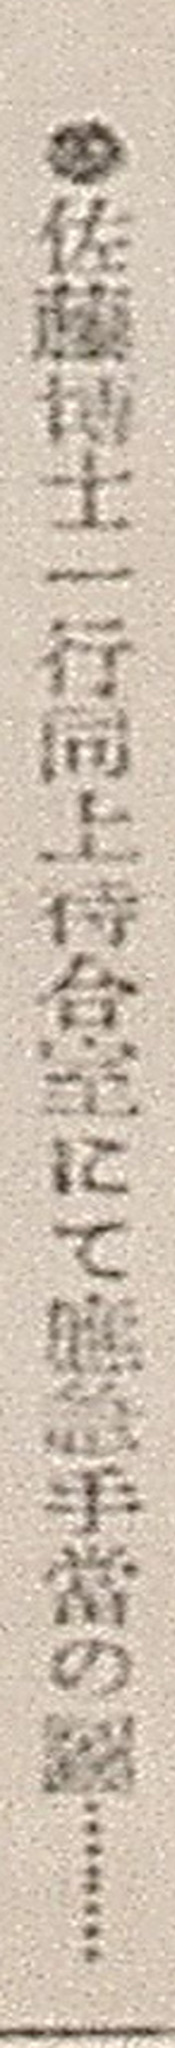●佐藤博士一行同上待合室にて応急手当の図・・
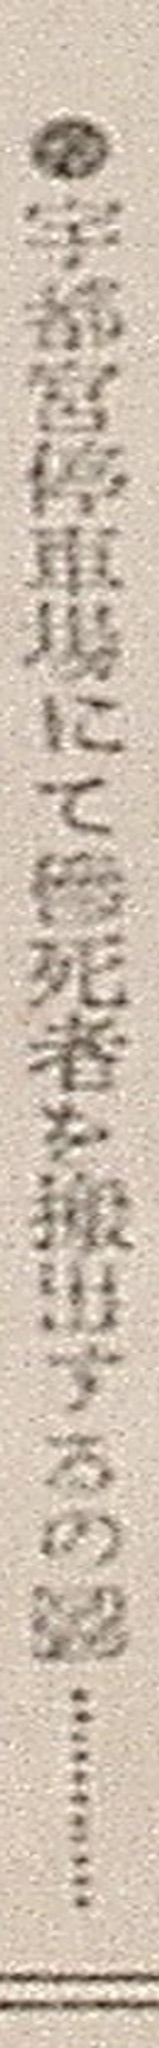●宇都宮停車場にて惨死者を搬出するの図・・・
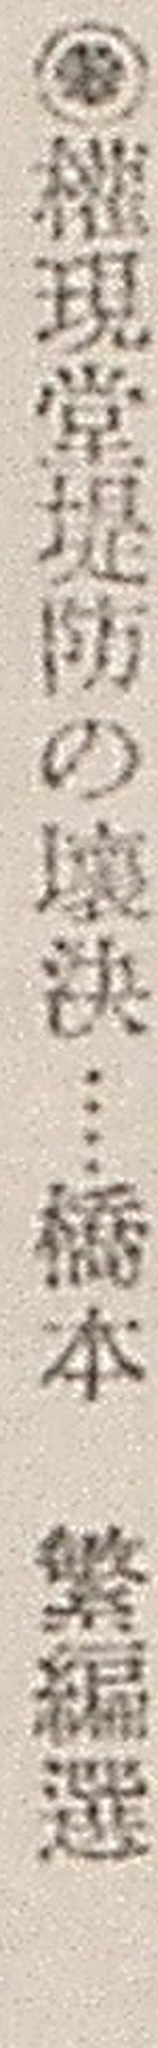⦿権現堂堤防の壊決・・橋本繁編選
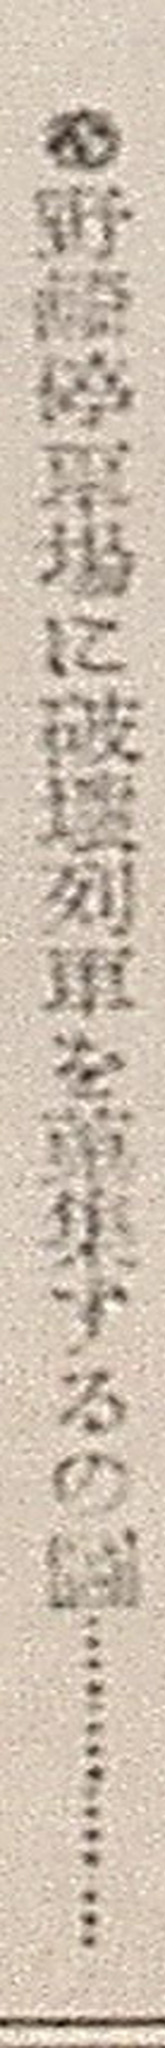●野崎停車場に破壊列車を蒐集するの図・・・・

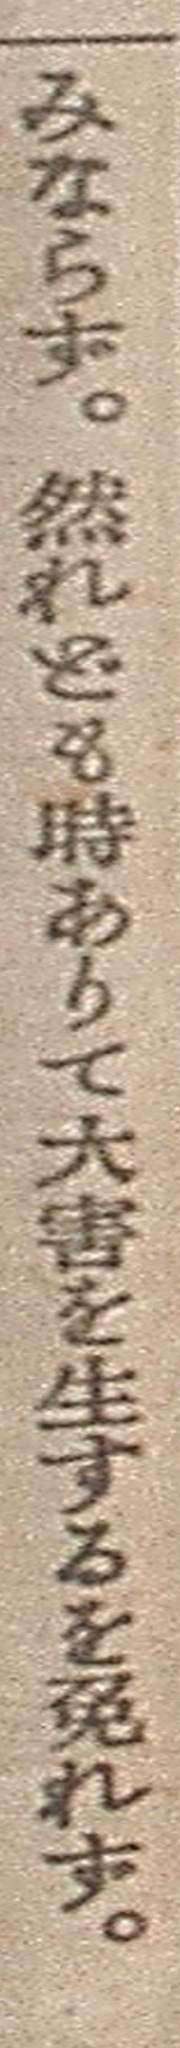みならず。然れども時ありて大害を生するを免れず。
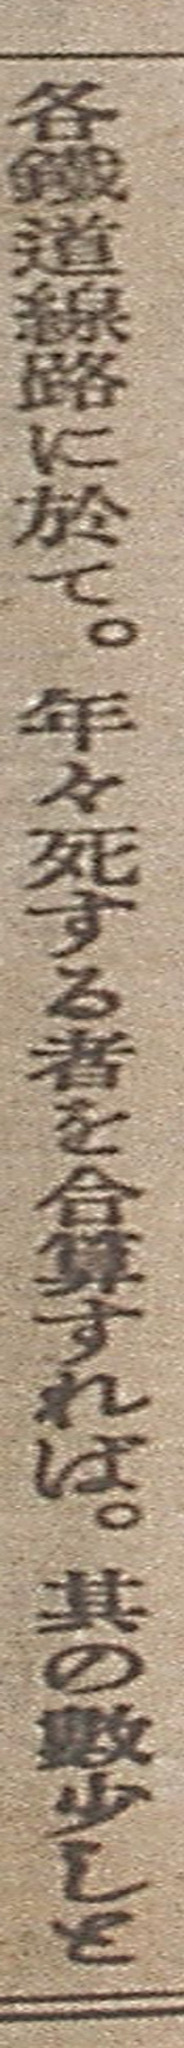各鉄道線路に於て。年々死する者を合算すれば。其の数少しと
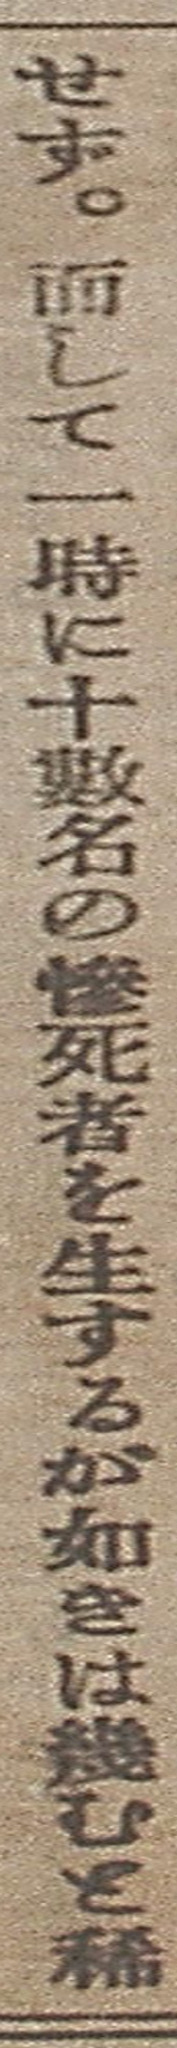せず。而して一時に十数名の惨死者を生するが如きは幾むと稀
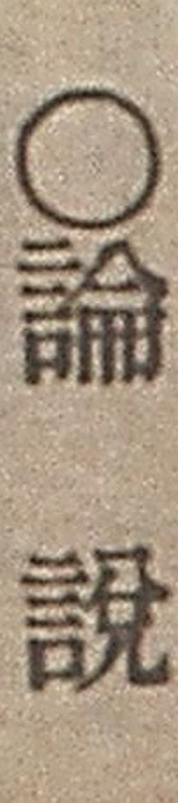〇論説
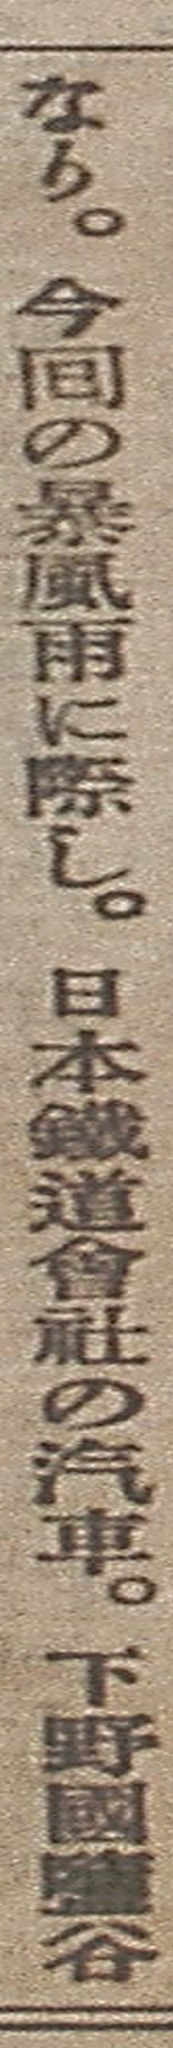なり。今回の暴風雨に際し。日本鉄道会社の汽車。下野国塩谷
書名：風俗畫報臨時増刊第百九十九號　明治三十二年十月各地災害圖會（前編之續）
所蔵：東京大学地震研究所図書室 Earthquake Research Institute Library, The University of Tokyo, JAPAN
